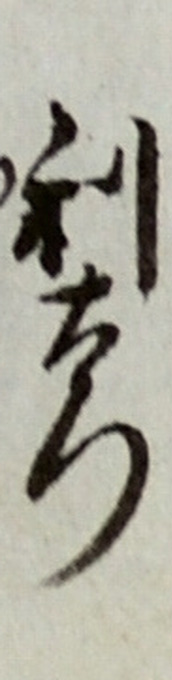武右衛門
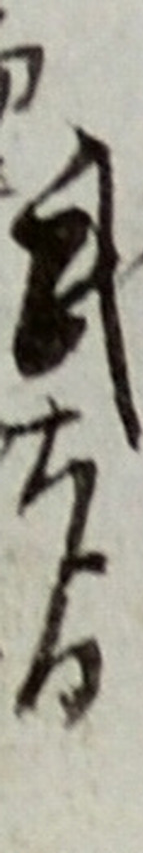武右衛門
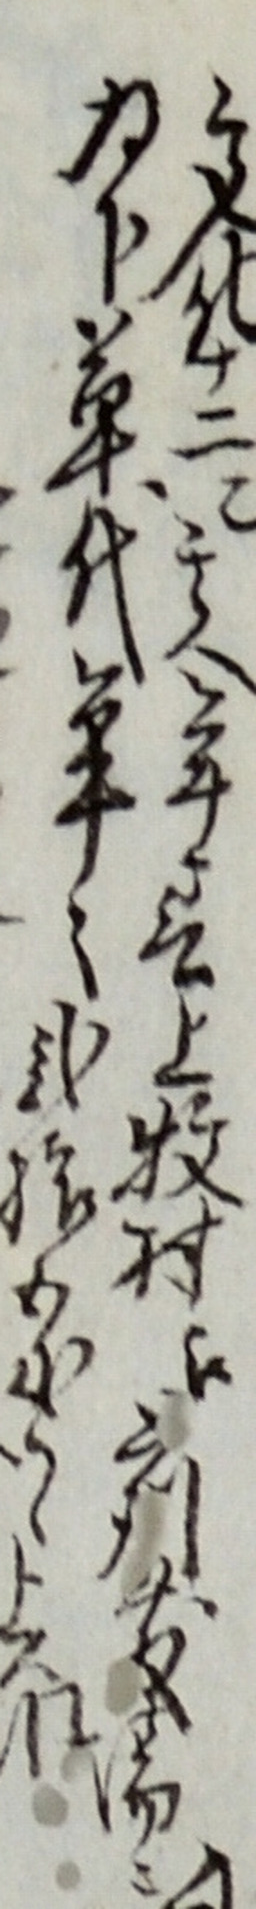為下草代年々弐拾五匁ツヽ上納
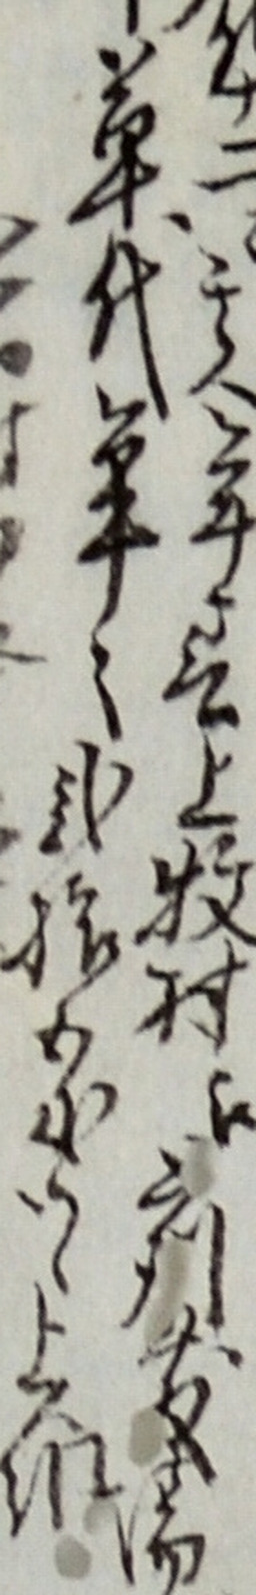為下草代年々弐拾五匁ツヽ上納

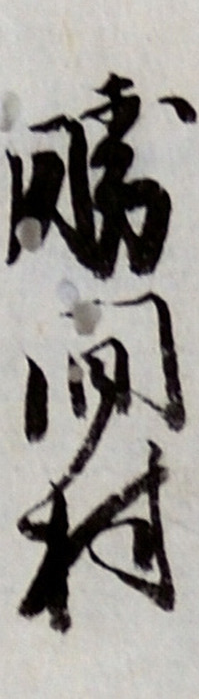勝間村
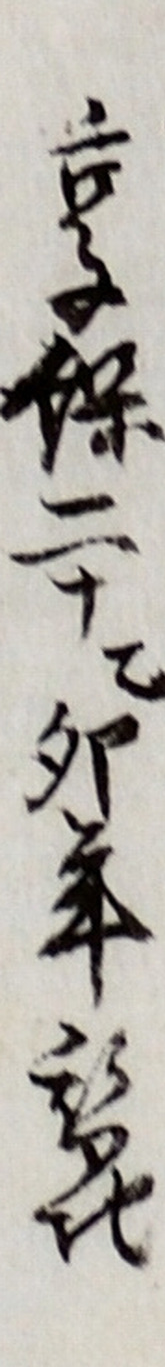享保二十乙卯年替地
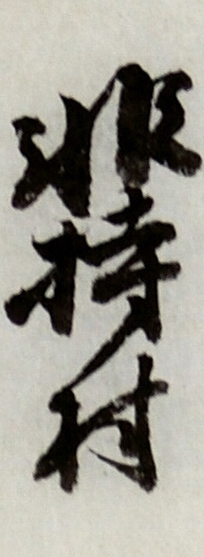非持村
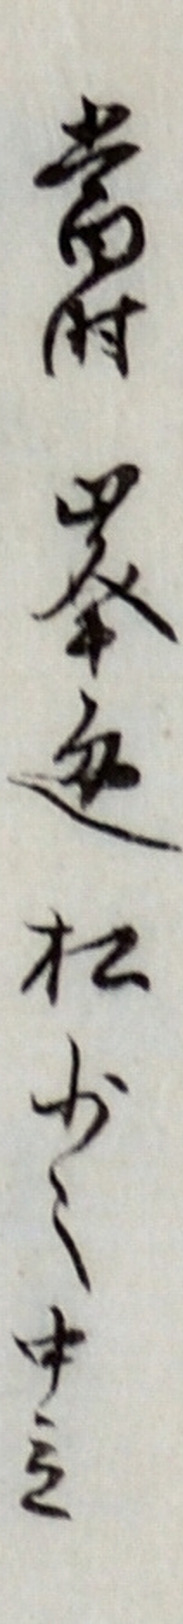当時峯通松少々中立
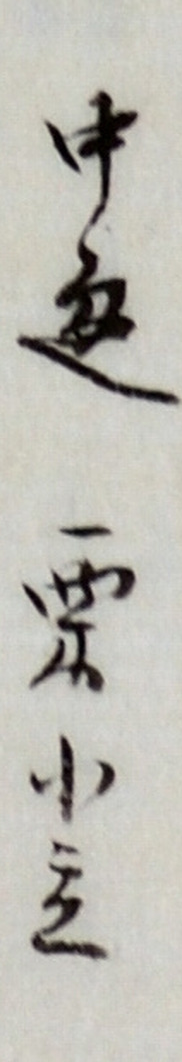中通栗小立
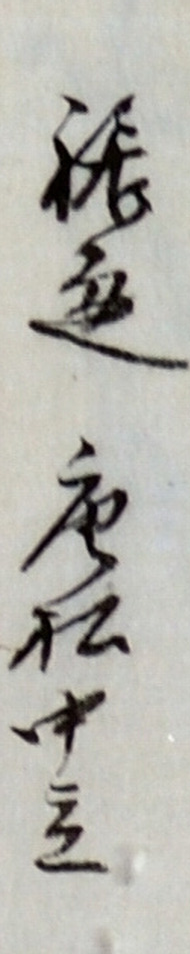裾通唐松中立

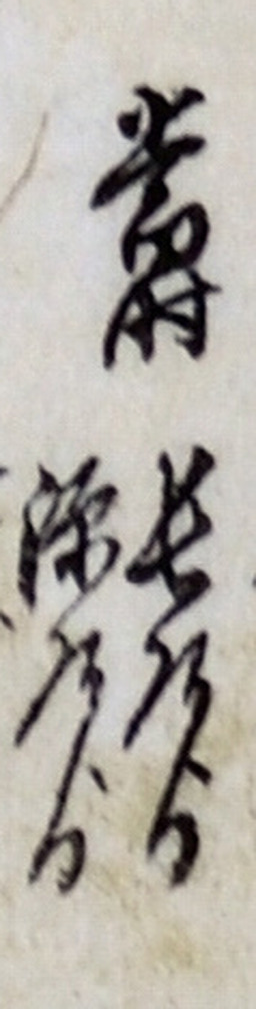小左衛門
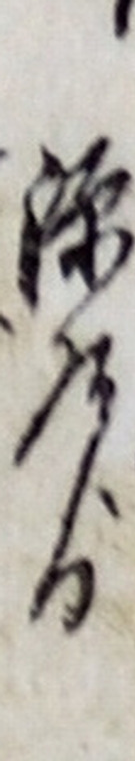小左衛門
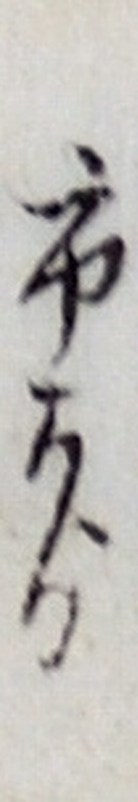治右衛門
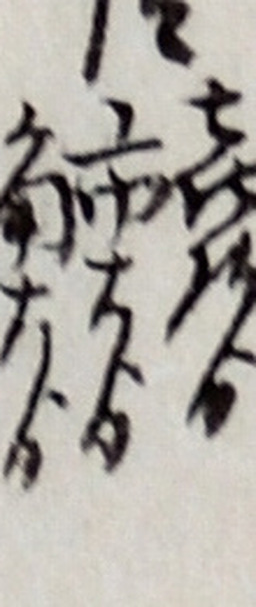治右衛門
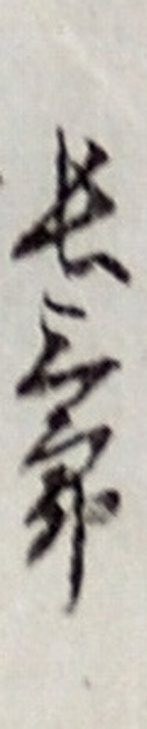長三郎
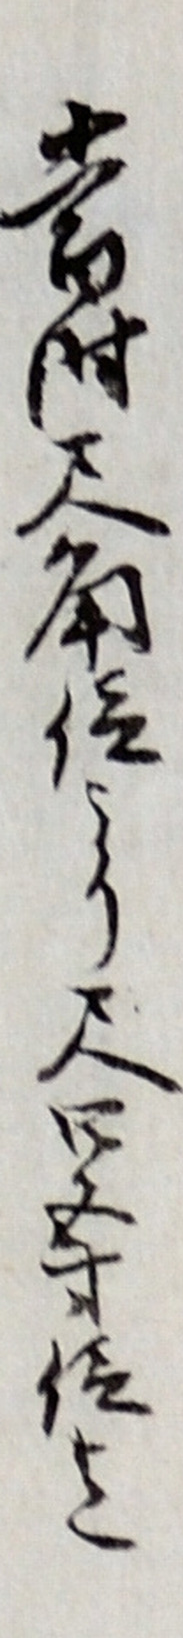当時尺角位より尺四五寸位迄
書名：郷中御林御竹薮名所附守之名前帳
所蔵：伊那市立高遠町図書館・合同会社AMANE
